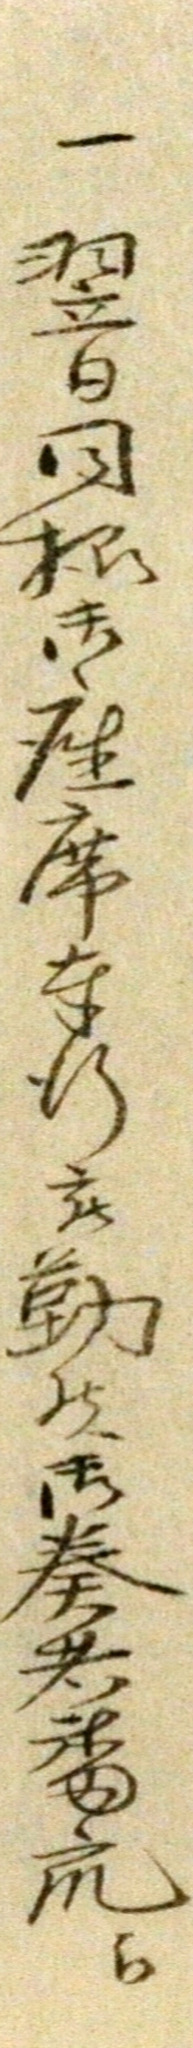一翌日同様御座席奉行被勤候御奏者番衆え
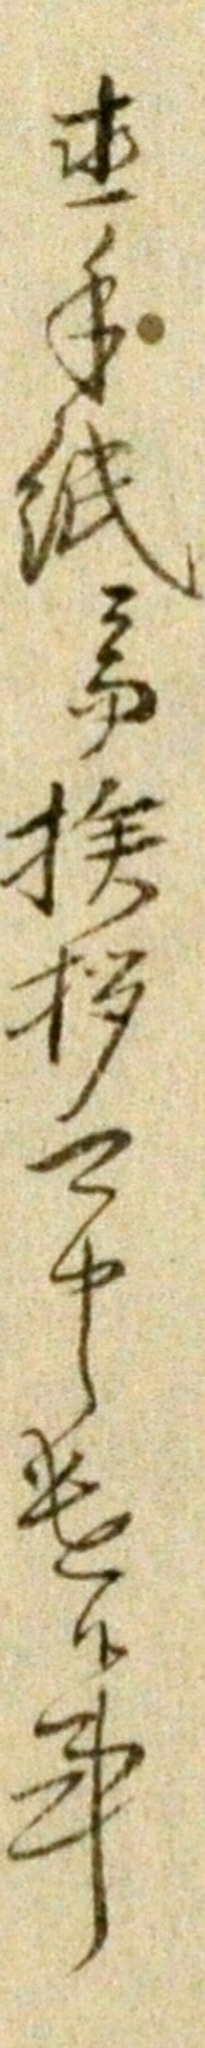直手紙ニ而挨拶可申遣候事
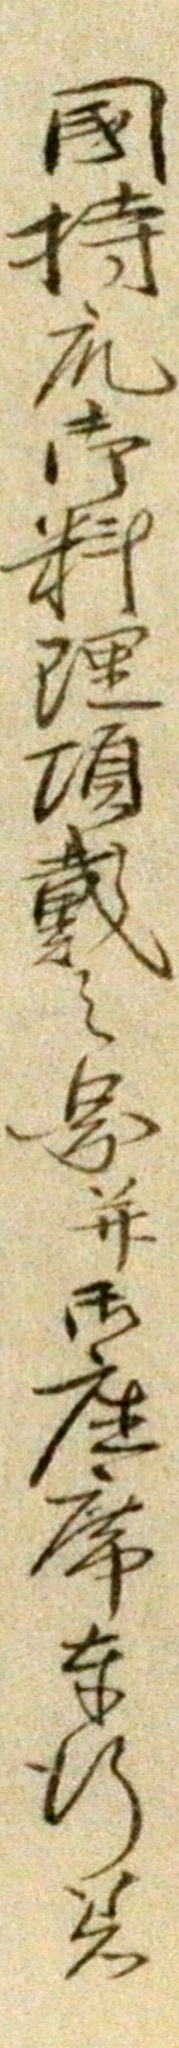國持衆御料理頂戴之圖并御座席奉行着
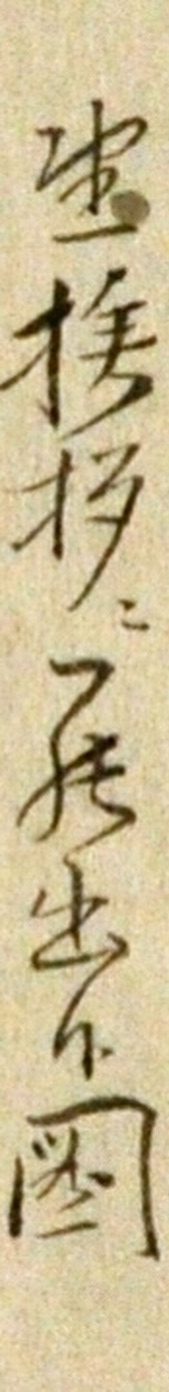座挨拶ニ罷出候図
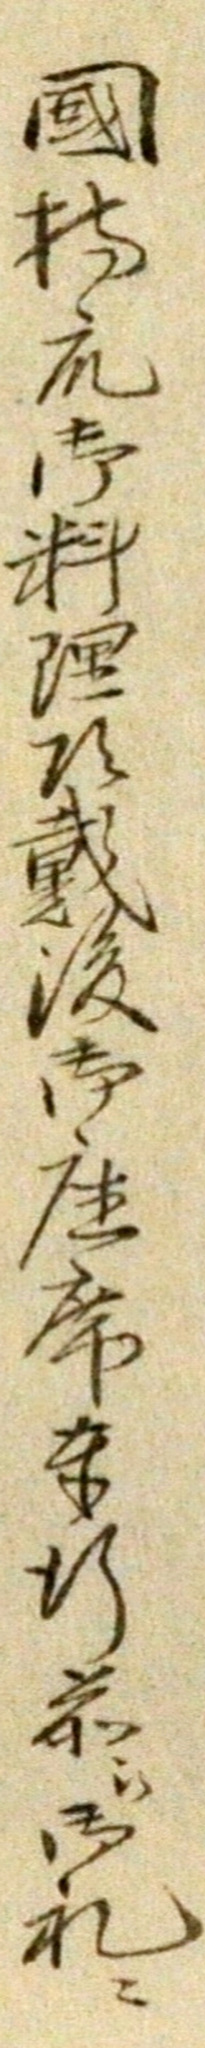國持衆御料理頂戴後御座席奉行前え御礼ニ
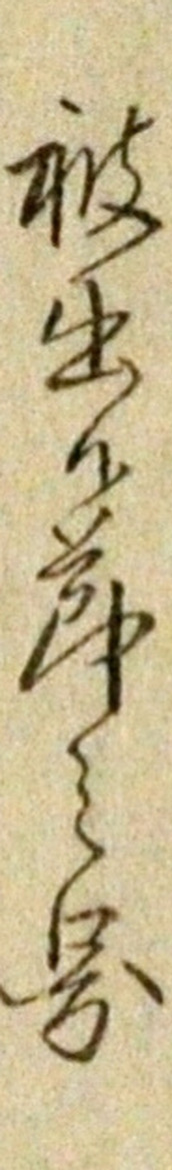被出候節之圖
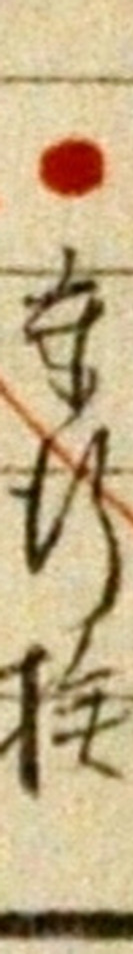●奉行挨

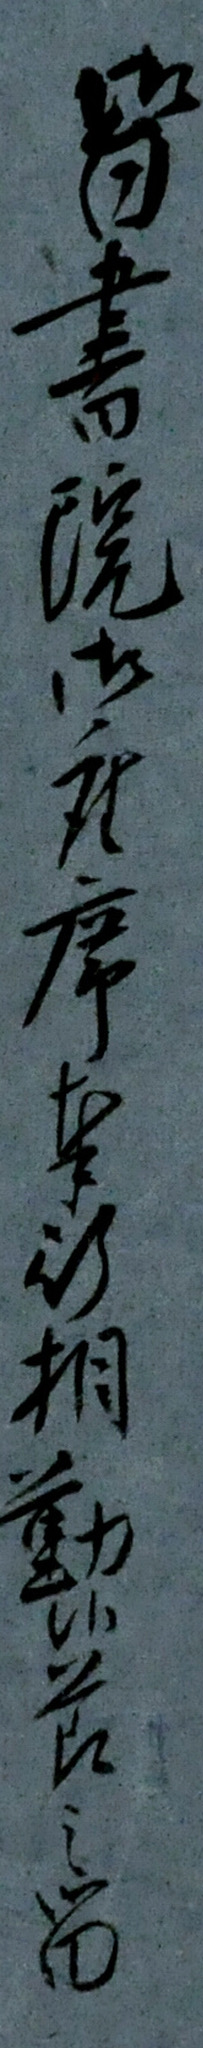御白書院御座席奉行相勤候節之留

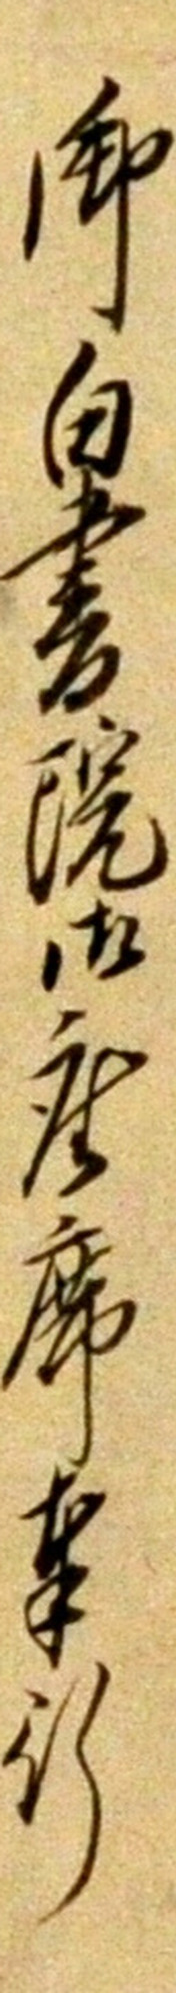御白書院御座席奉行
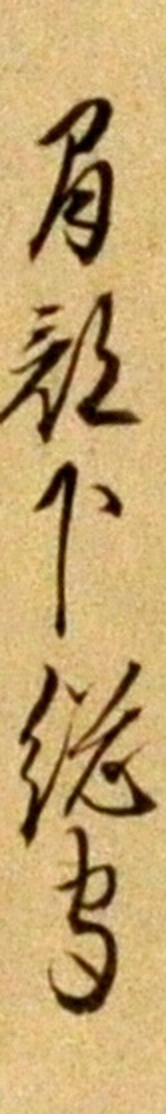間部下総守
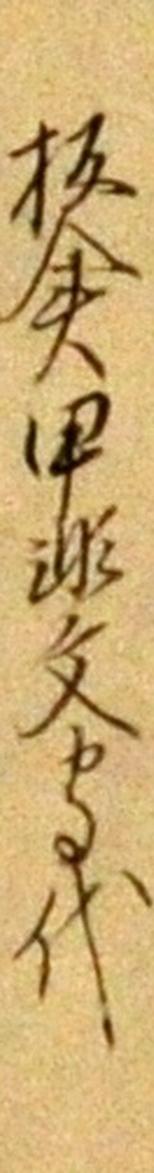板倉甲斐守代
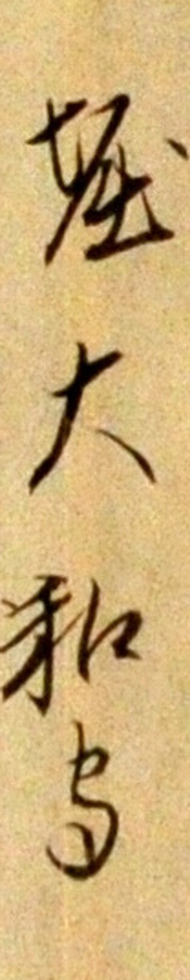堀大和守
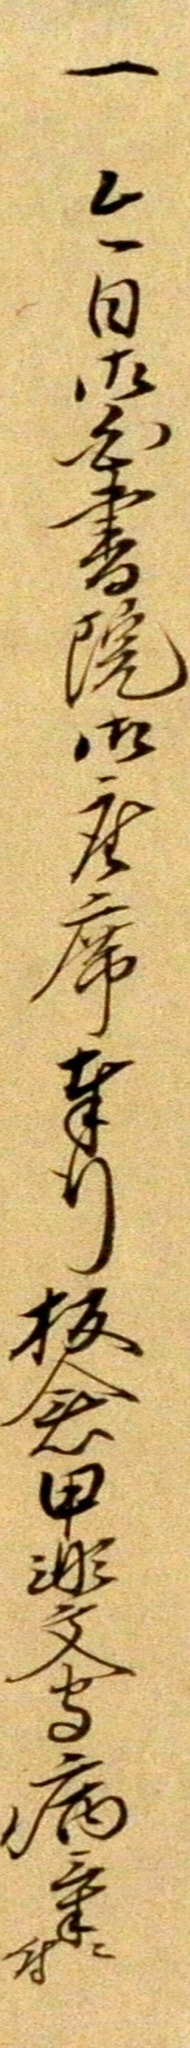一今日御白書院御座席奉行板倉甲斐守病気ニ付
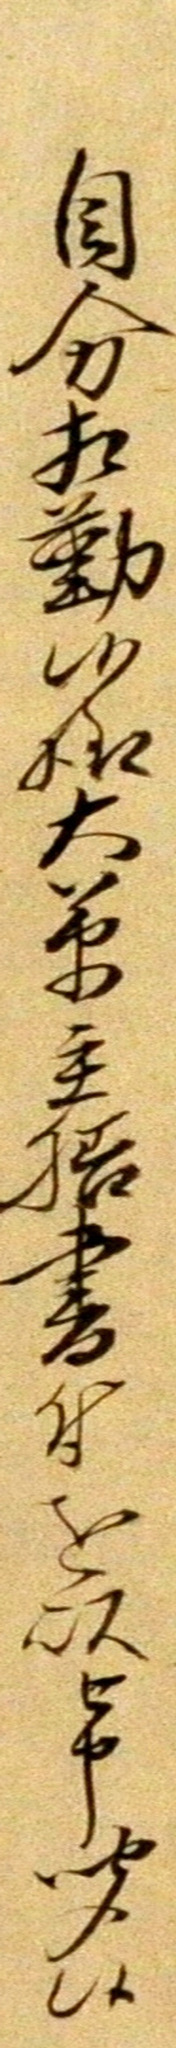自分相勤候様大草主膳書付を以被申聞候
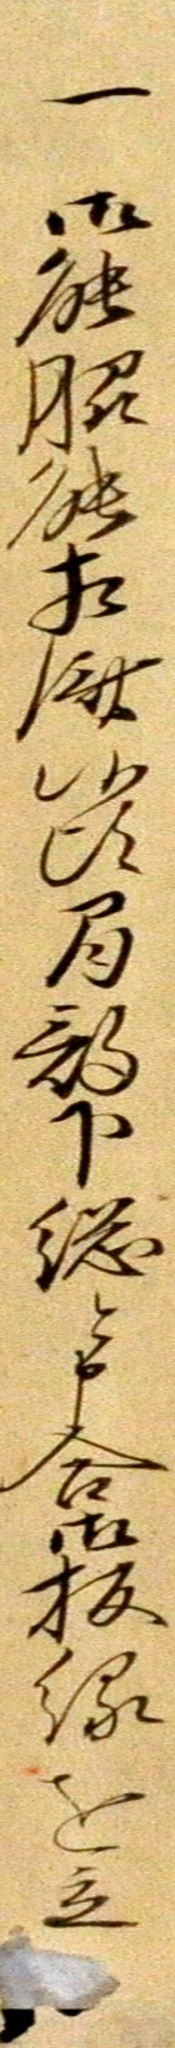一御能脇能相済候頃間部下総と申合御板縁を立
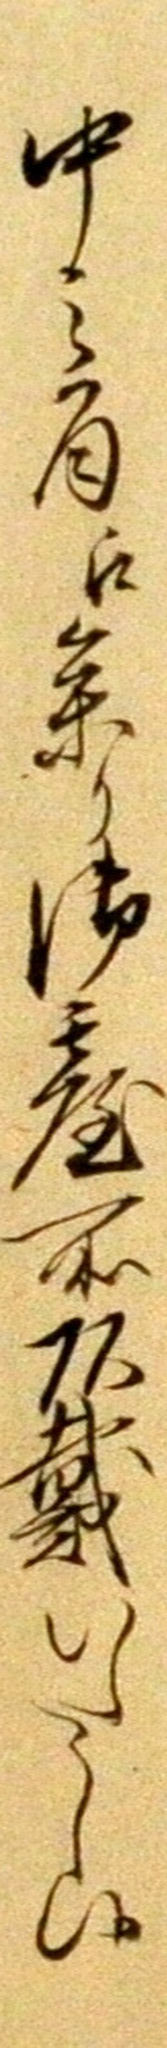中之間え参り御臺所頂戴いたし候
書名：御白書院御座席奉行勤方留外
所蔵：伊那市立高遠町図書館・合同会社AMANE
